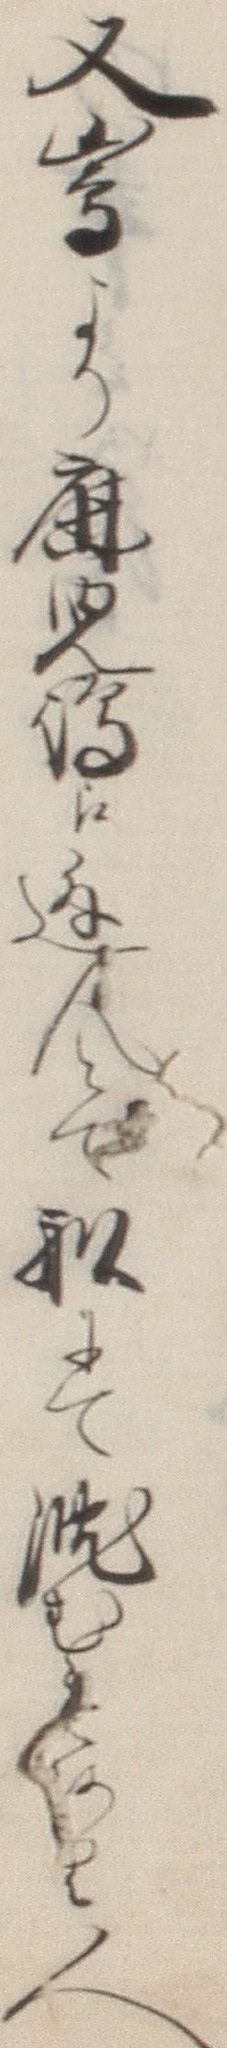又嶋より鹿児島え逃出とて舩にて眺むとある人
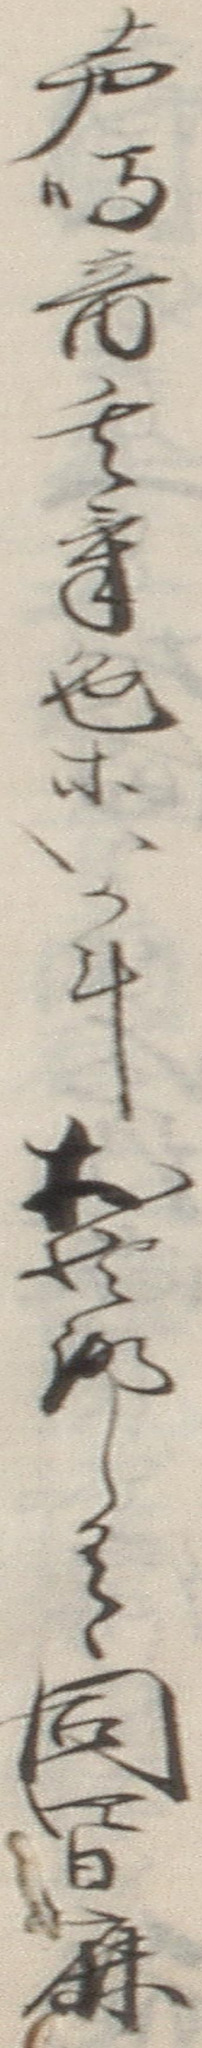声鳴音其気色等いか斗おそろしくて同四日鹿
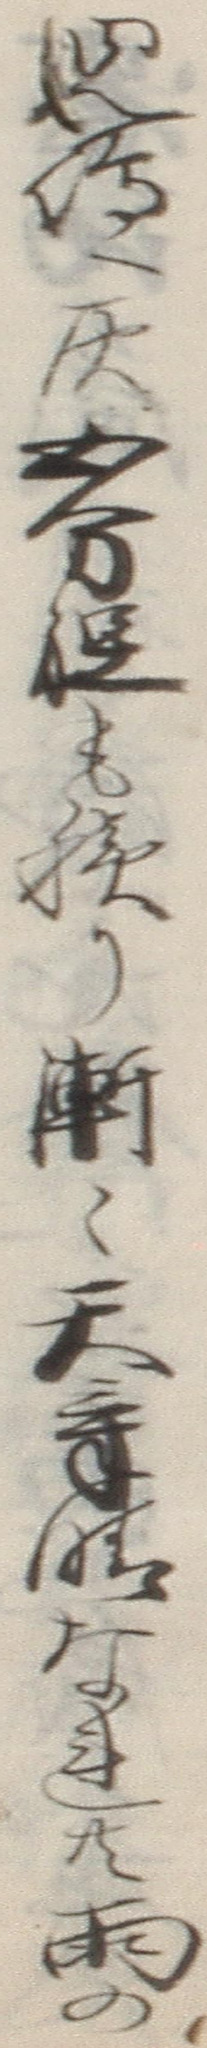児島へ灰五分程も積り漸く天気晴なれ共雨の
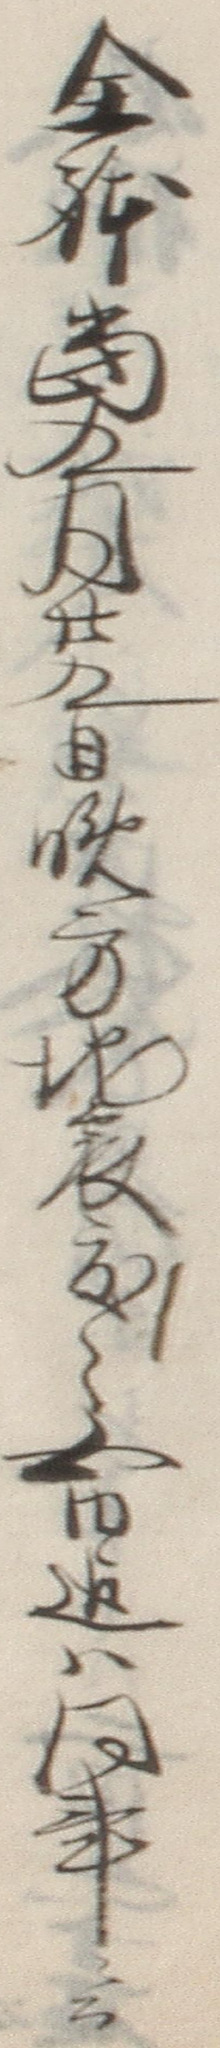全躰当九月廿九日晩方地震度々五日迄ハ同事ニ而
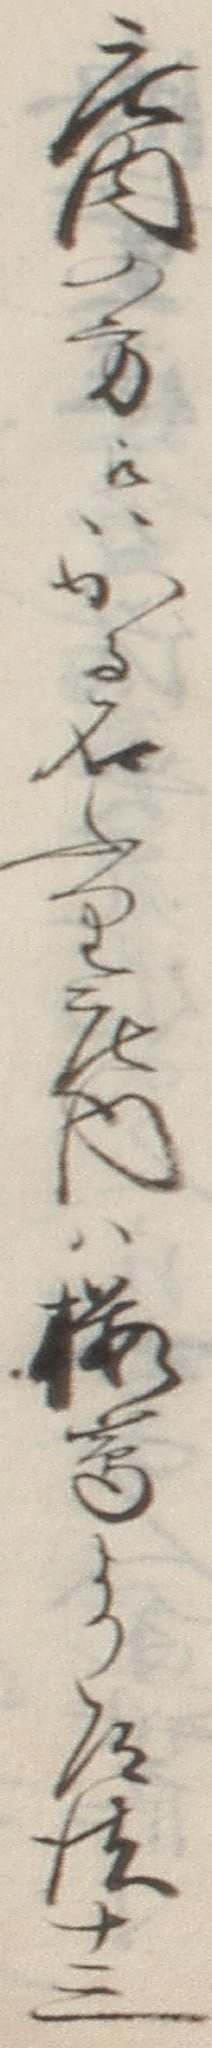庄内の方えハかる石ふり庄内ハ桜島より道法十三
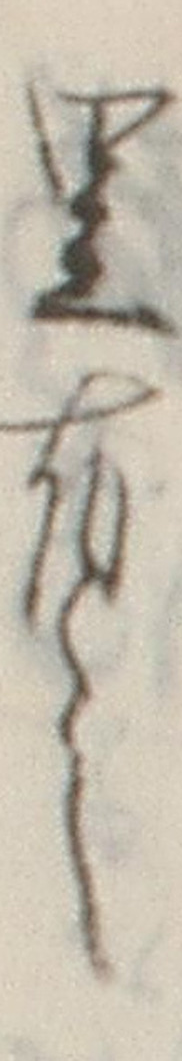里有之

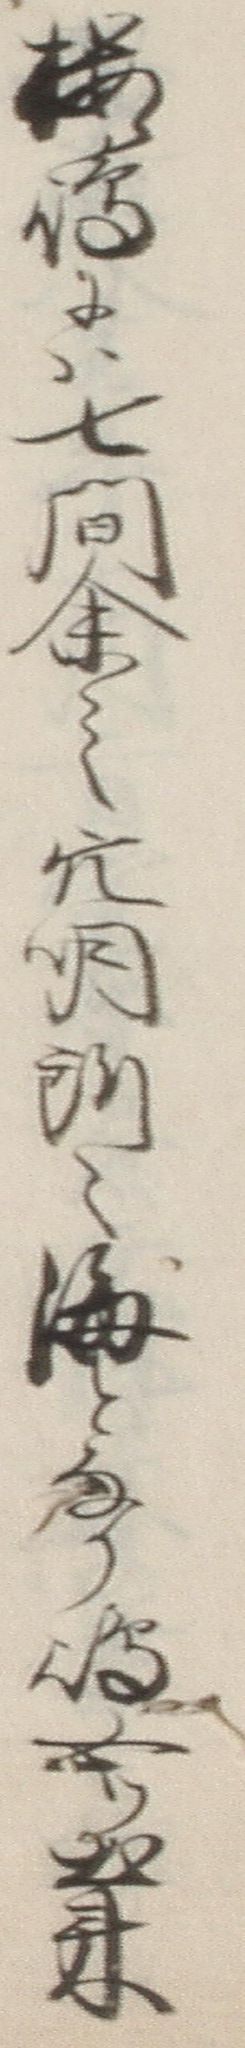桜島にハ七間余の穴明所々海となり嶋五ツ出来
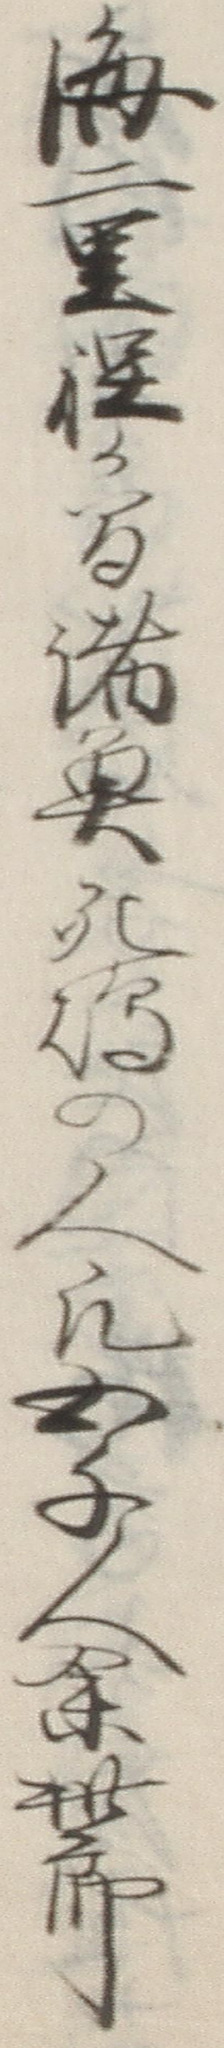海二里程か間諸魚死嶋の人凡五千人余此節
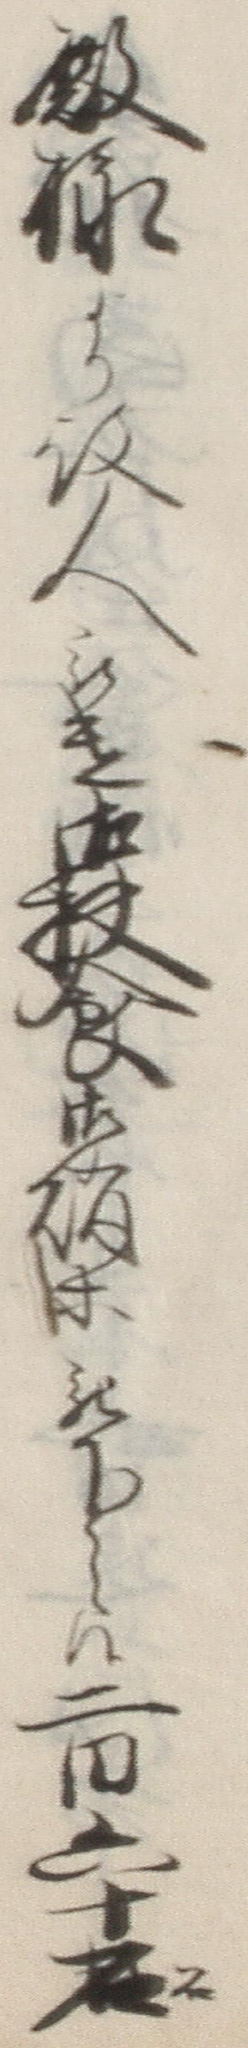殿様より役人被遣御無扶食御賄等被下候二日六十石
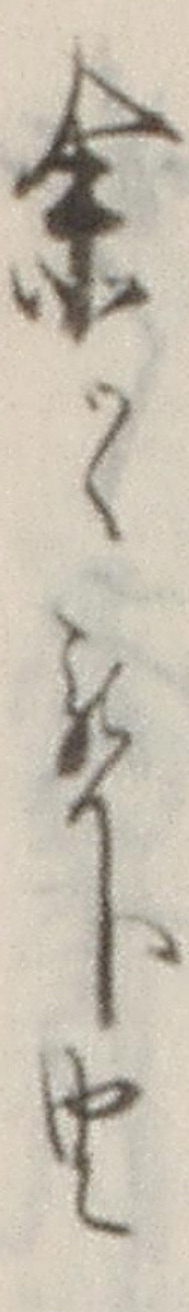余ツゝ被下由
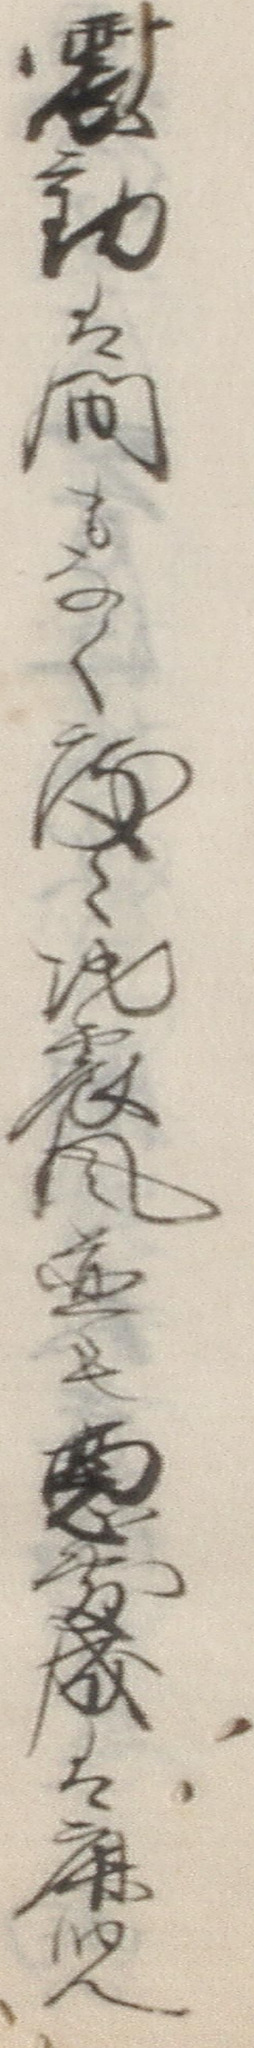震動は間もなく度々地震風並も悪敷成は鹿児
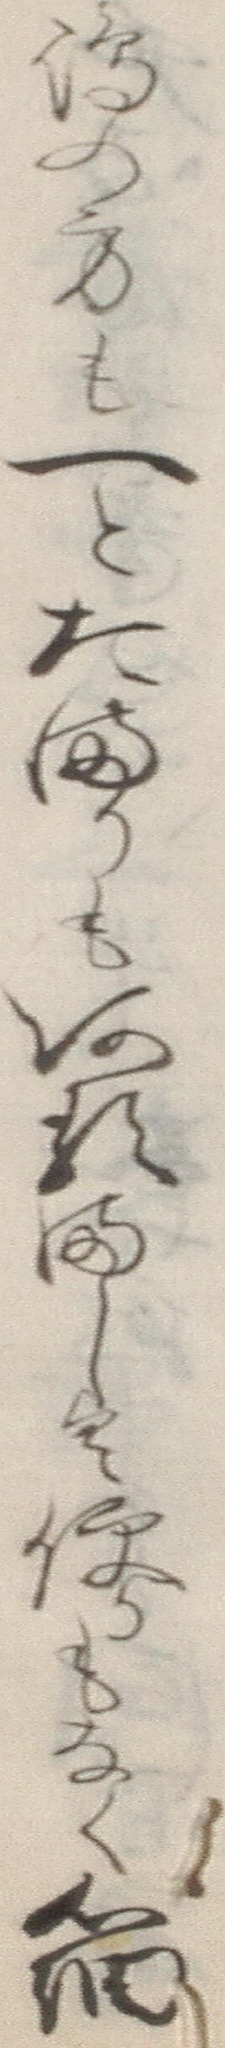嶋の方も一とたまりもあるましく便りもなく心細
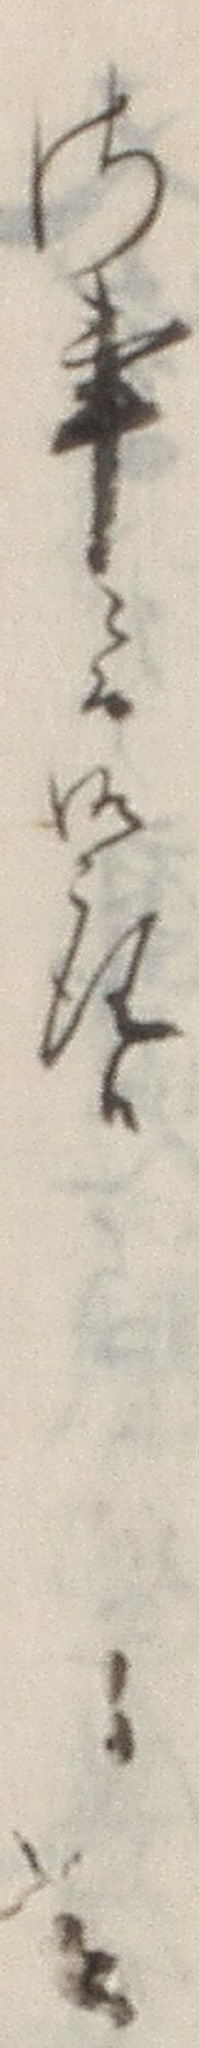御事ニ而御座候
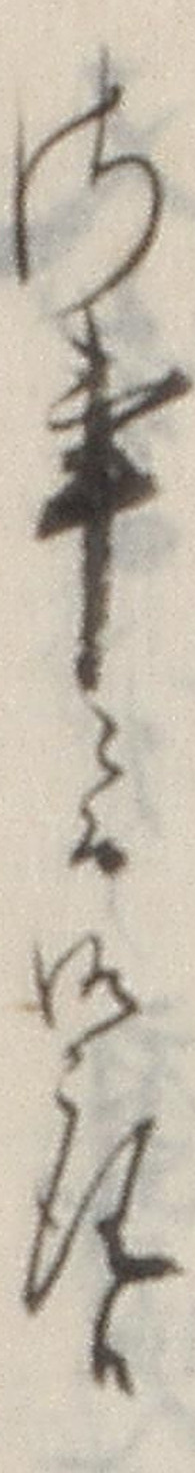御事ニ而御座候
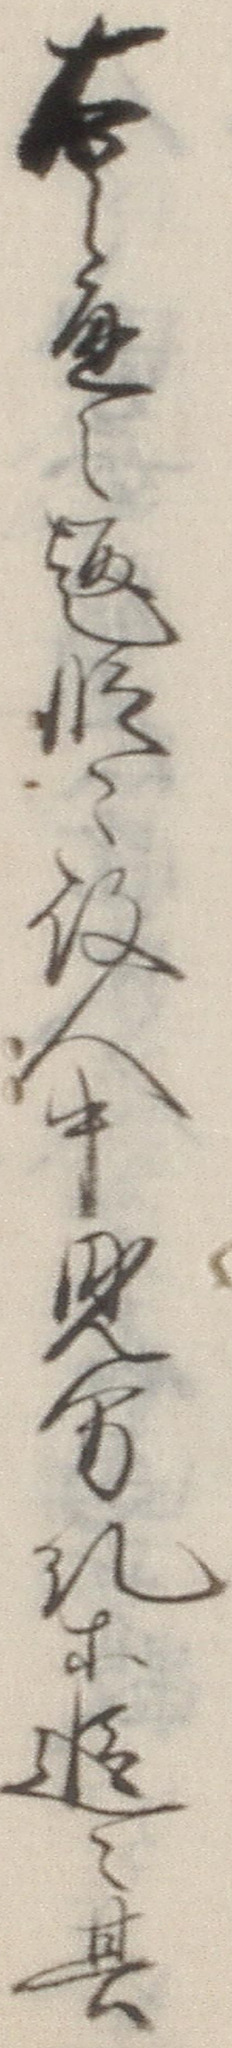右の通の趣段々役人中見分糺等追々其
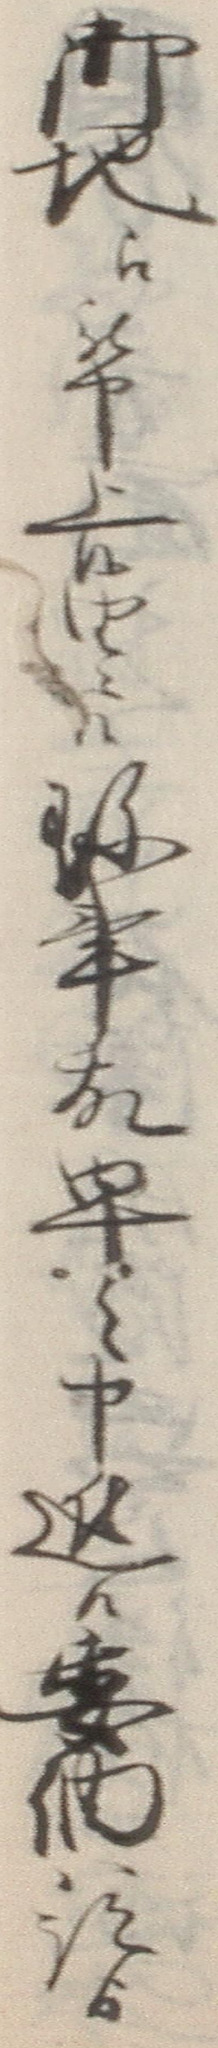御地え被申上候由ニハ珍事故早々申進候委細ハ跡ゟ
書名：[諸国災害記録]
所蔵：東京大学地震研究所図書室 Earthquake Research Institute Library, The University of Tokyo, JAPAN
